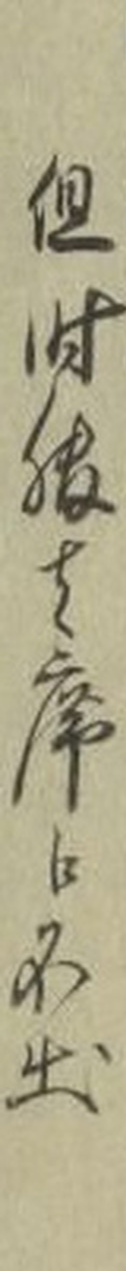但時服は席え不出
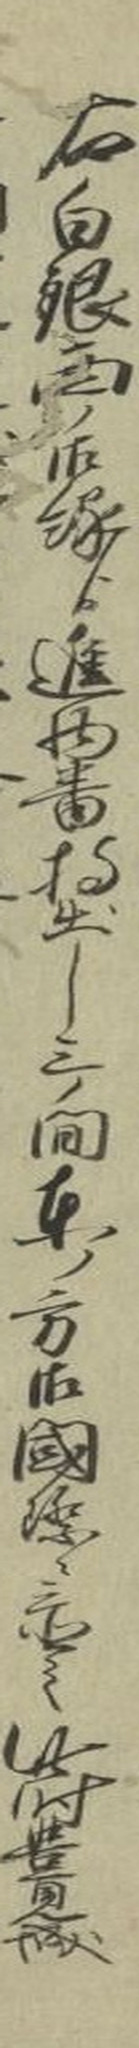右白銀西の御縁ゟ進物番持出し三の間東の方御閾際に置之此時豊見城
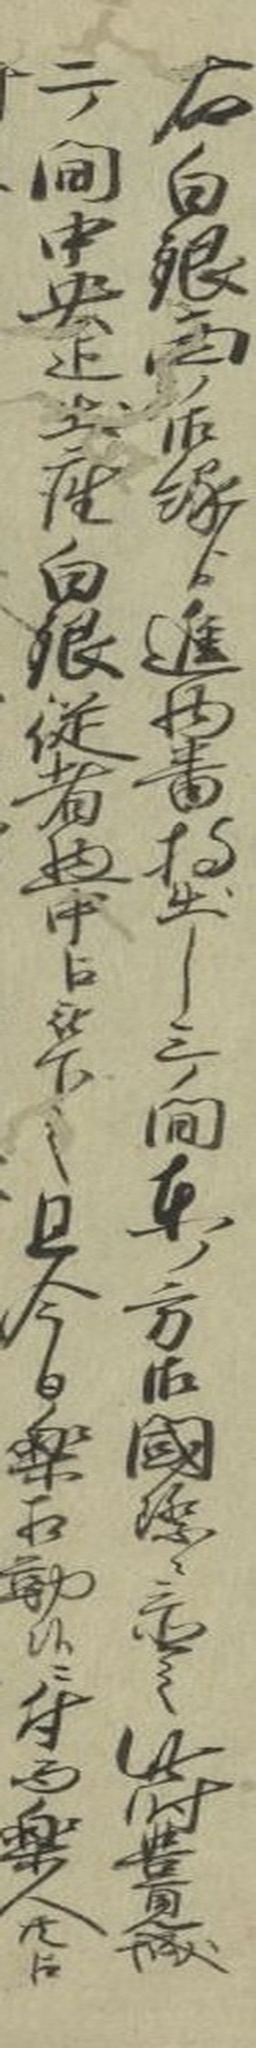二の間中央迄出座白銀従者惣中え被下之且今日楽相勤候に付て楽人共え
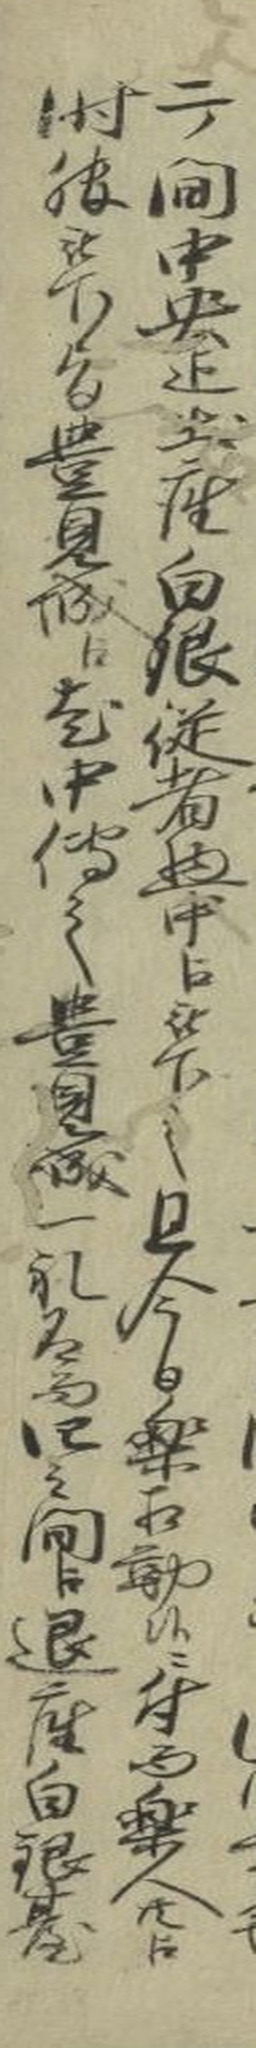時服被下旨豊見城え老中伝之豊見城一礼有て四之間え退座白銀台

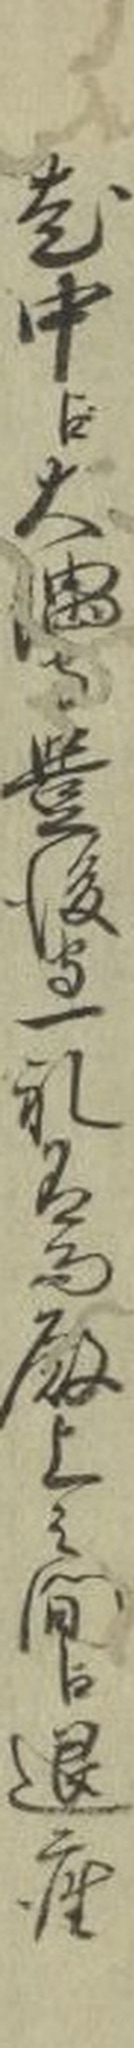一老中え大隅守豊後守一礼有て殿上之間え退座
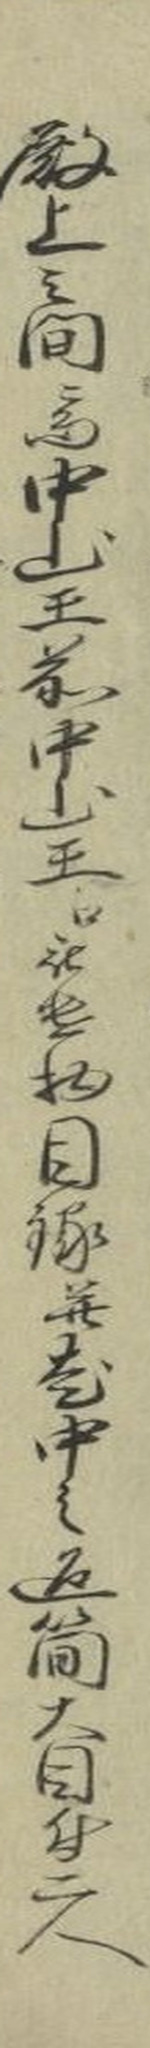一殿上之間にて中山王前中山王え被遣物目録并老中之返簡大目付二人
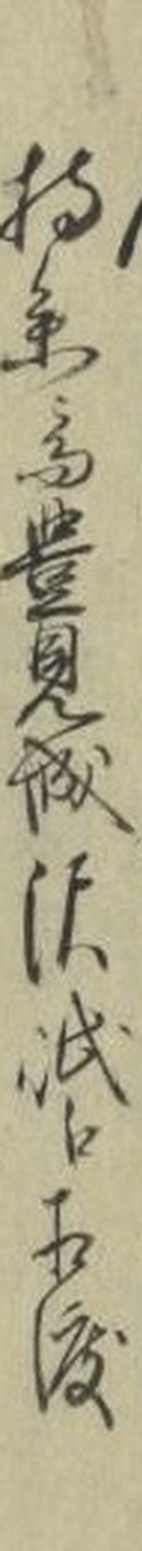持参にて豊見城沢岻え相渡
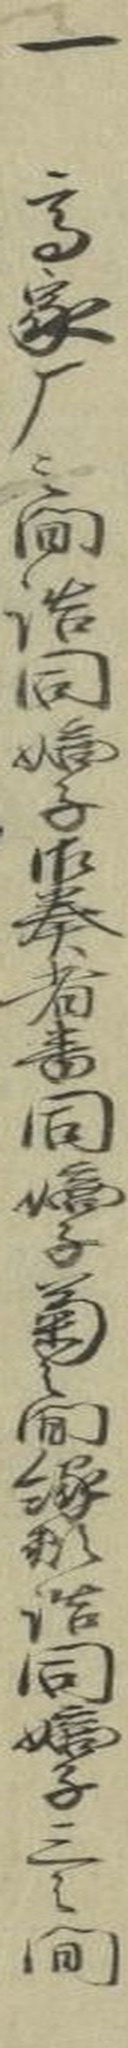一高家鴈之間詰同嫡子御奏者番同嫡子菊之間縁頬詰同嫡子三之間
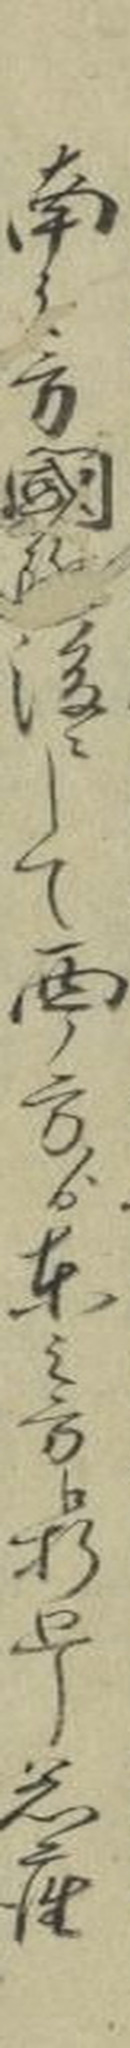南之方閾際後にして西の方ゟ東之方え折廻し着座
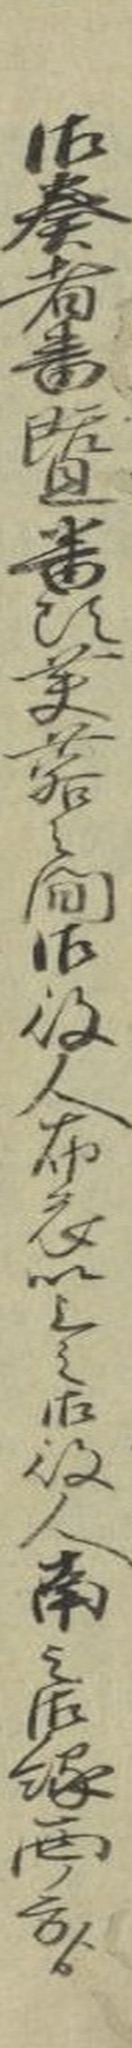一御奏者番曁番頭芙蓉之間御役人布衣以上之御役人南之御縁西の方ゟ
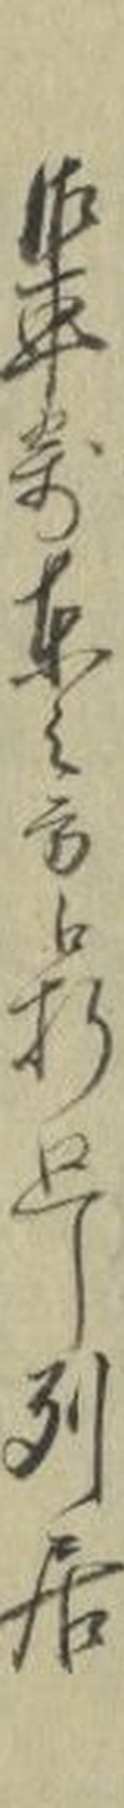御車寄東之方え折廻し列居
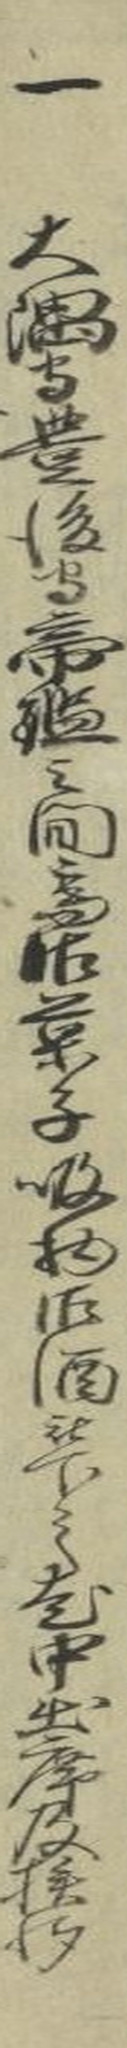一大隅守豊後守帝鑑之間にて御菓子吸物御酒被下之老中出席及挨拶
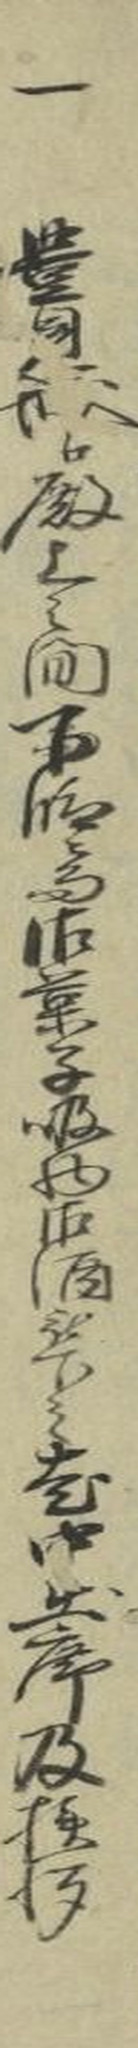一豊見城殿上之間下段にて御菓子吸物御酒被下之老中出席及挨拶
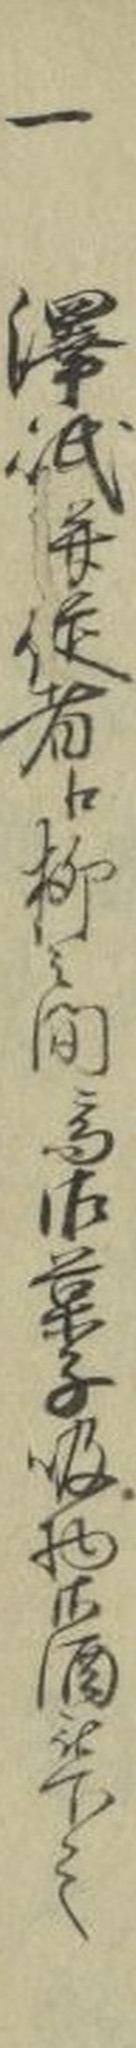一沢岻并従者え柳之間にて御菓子吸物御酒被下之
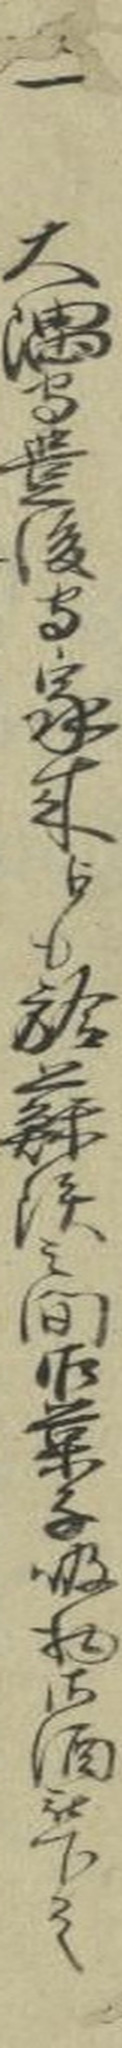一大隅守豊後守家来えも於蘇鉄之間御菓子吸物御酒被下之
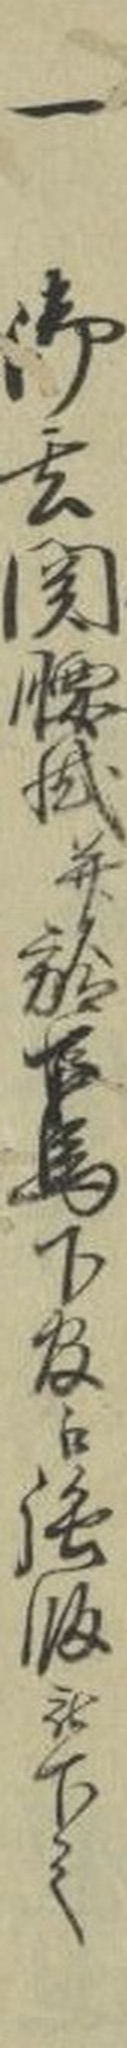一御玄関腰掛并於下馬下官え強飯被下之
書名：天保三壬辰年琉球人参府之節勤方書留
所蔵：University of the Ryukyus Library
